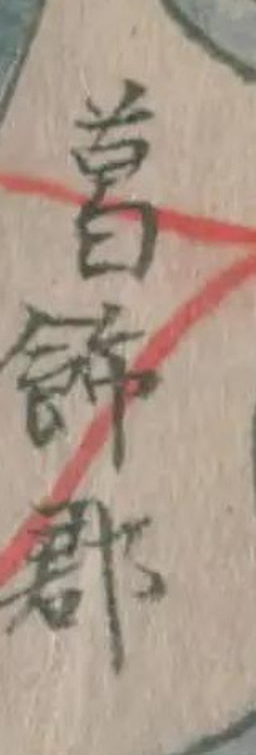葛飾郡
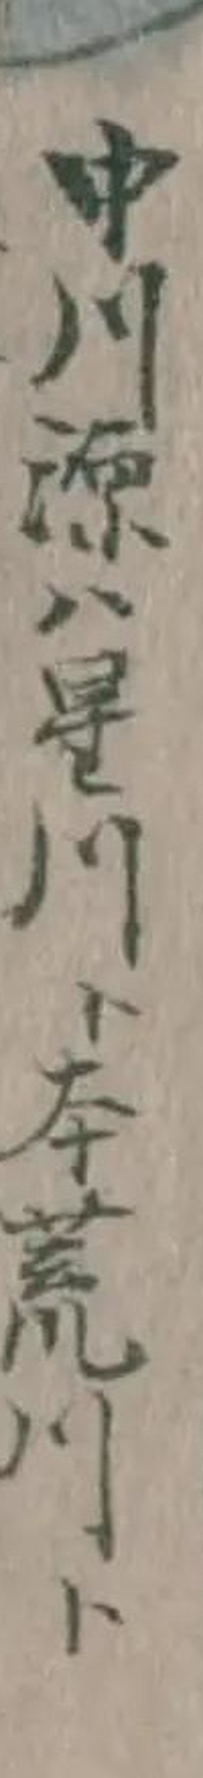中川源ハ星川ト本荒川ト
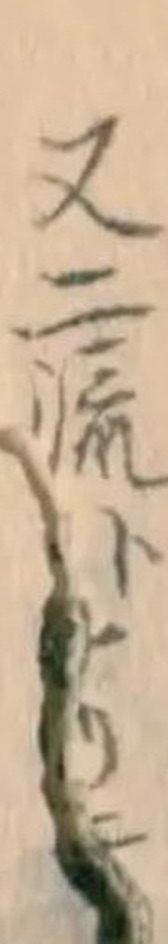又二流トナリテ
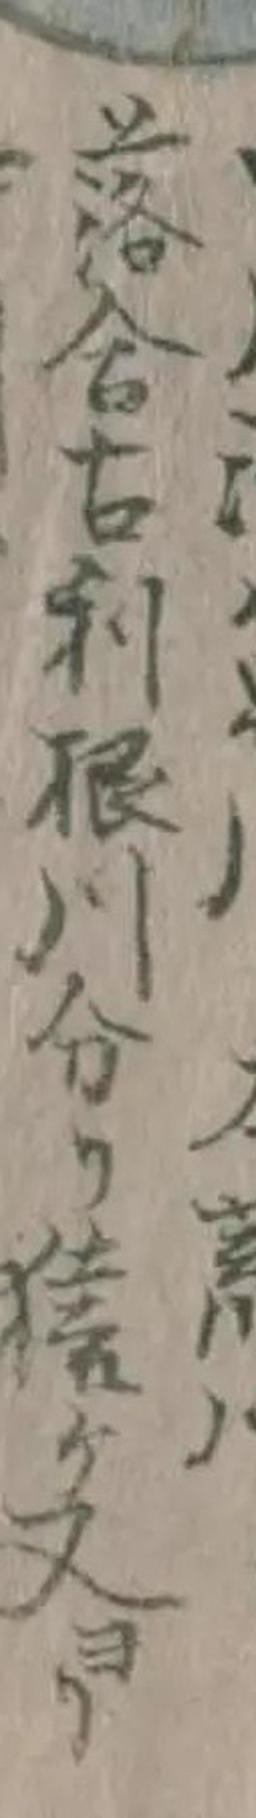落合古利根川分リ猿ヶ又ヨリ
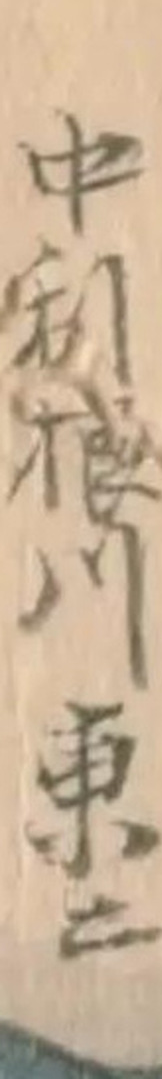中利根川東ニ
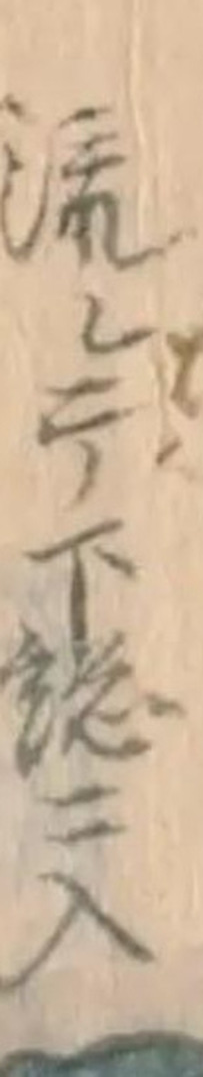流レテ下総ニ入
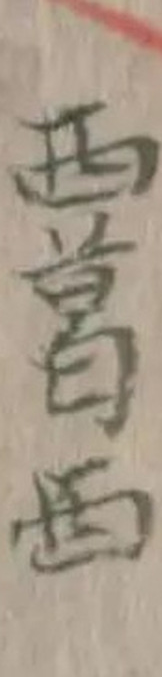西葛西
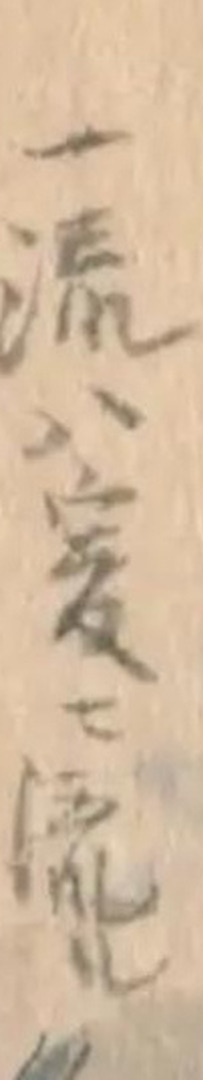一流ハ爰ニ流ル
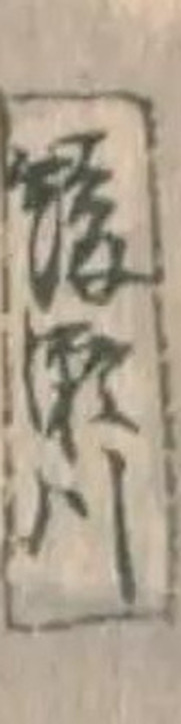綾瀬川
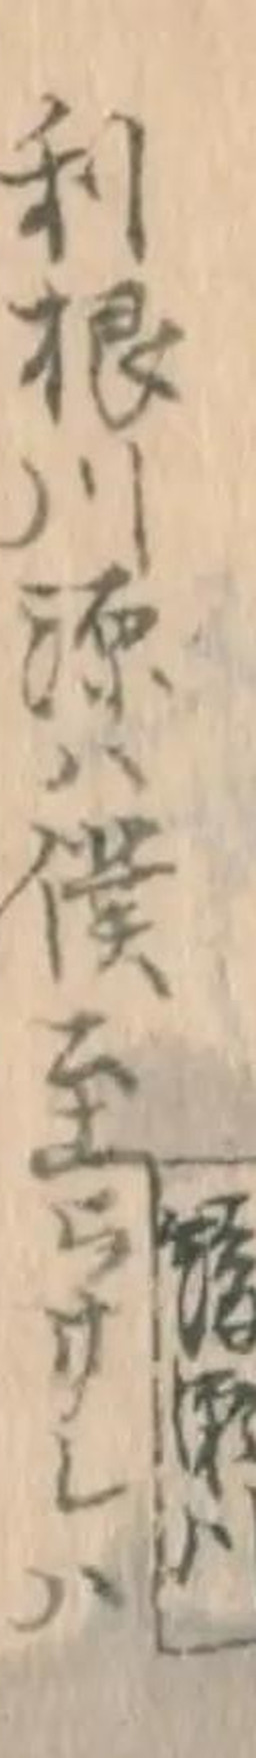利根川源ハ僕至ラサレハ
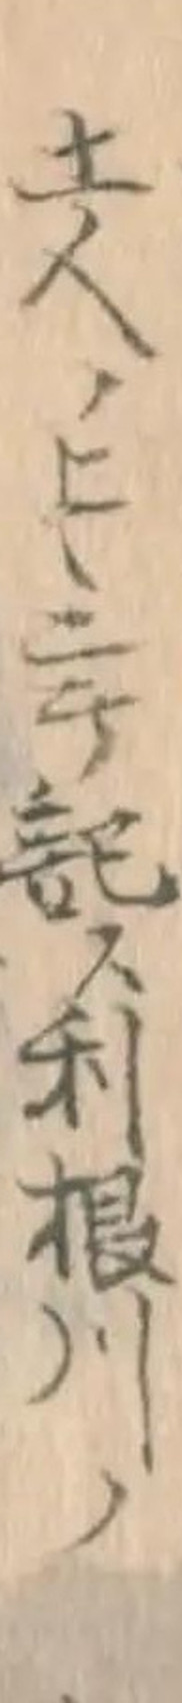土人ノヒヽニテ記ス利根川ノ
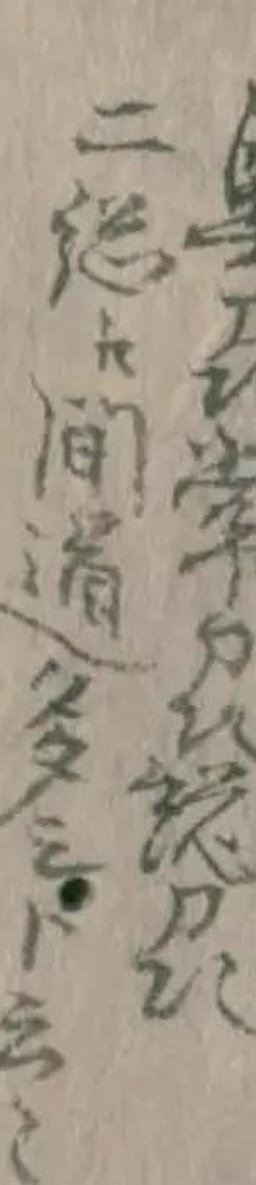二総え間道多シト云々
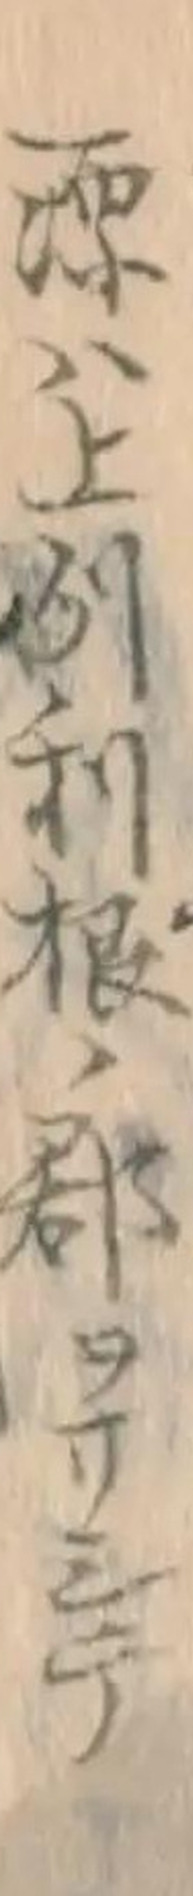源ハ上州利根ノ郡ヲサシテ
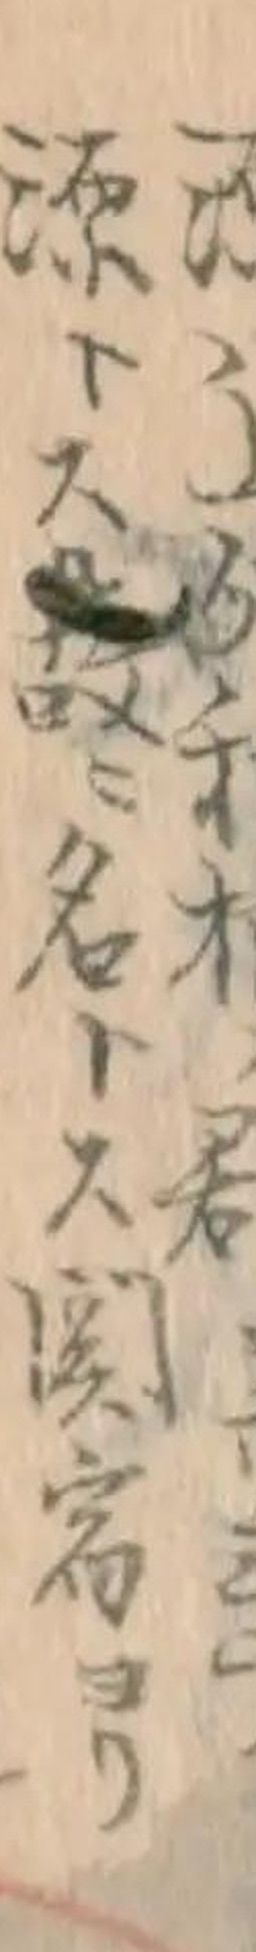源トス故ニ名トス関宿ヨリ
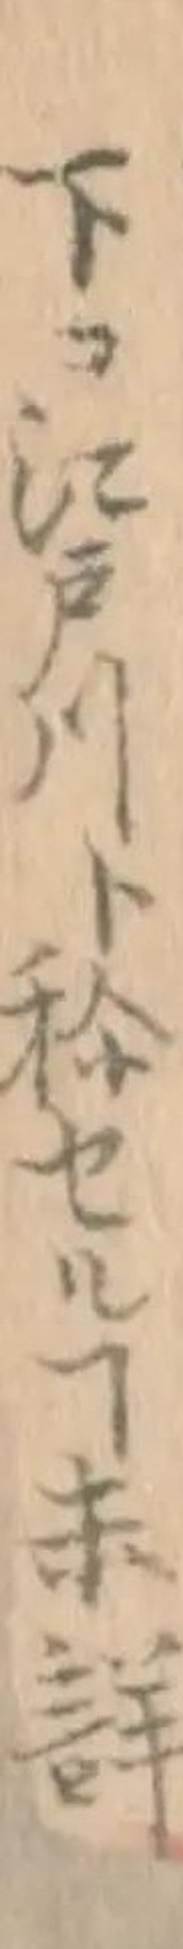下ヲ江戸川ト称セルコト未詳

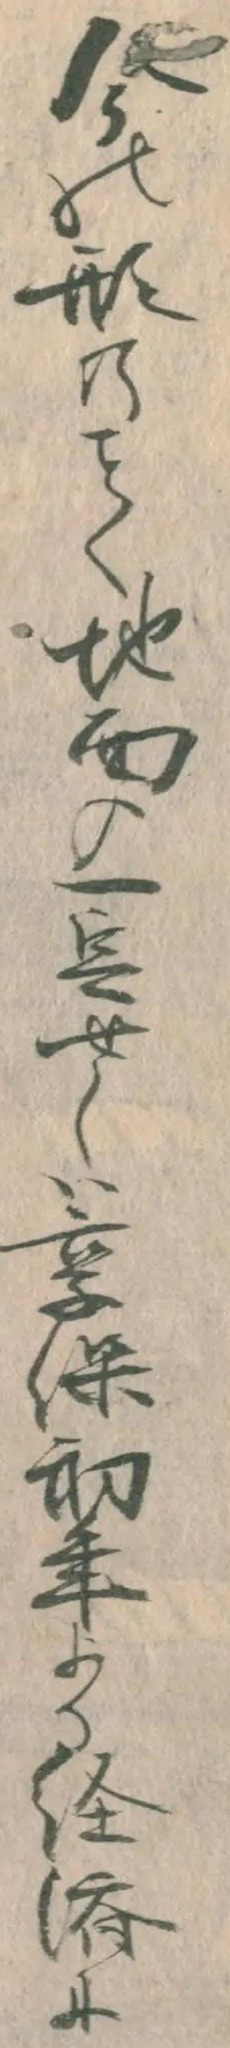今の形のことく地面の一定せしは享保初年より経済に
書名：四神地名録 6巻. [4]葛飾郡
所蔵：国立国会図書館 National Diet Library, JAPAN
